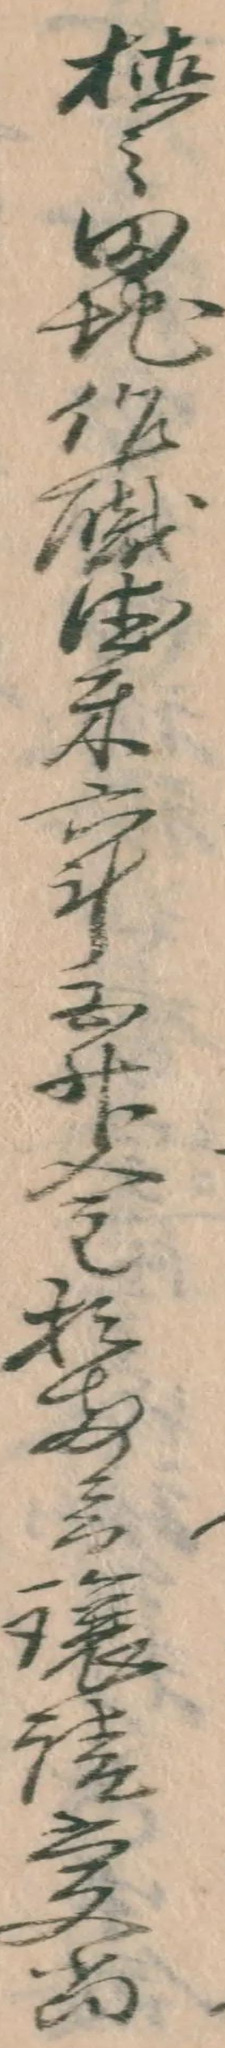植之田地作職徳米六斗五升金杉両ニ而譲請尚又當
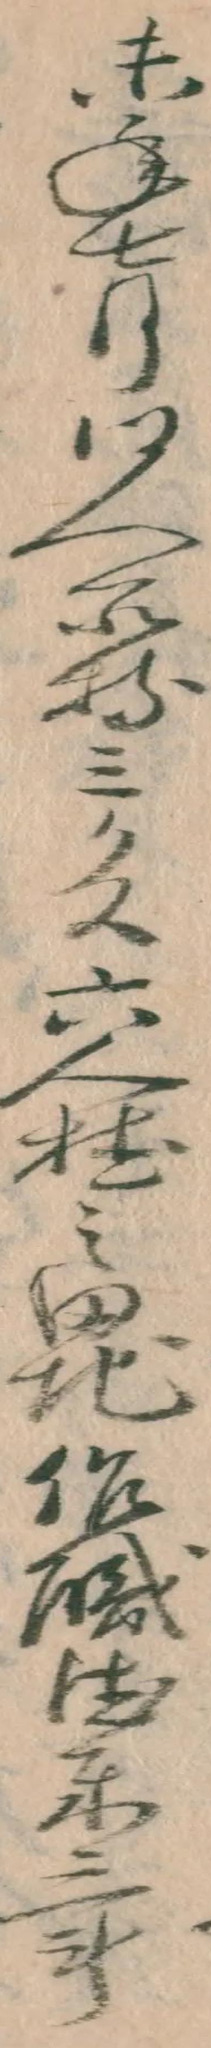未年七月同人所持ミクス六人植之田地作職徳米三斗
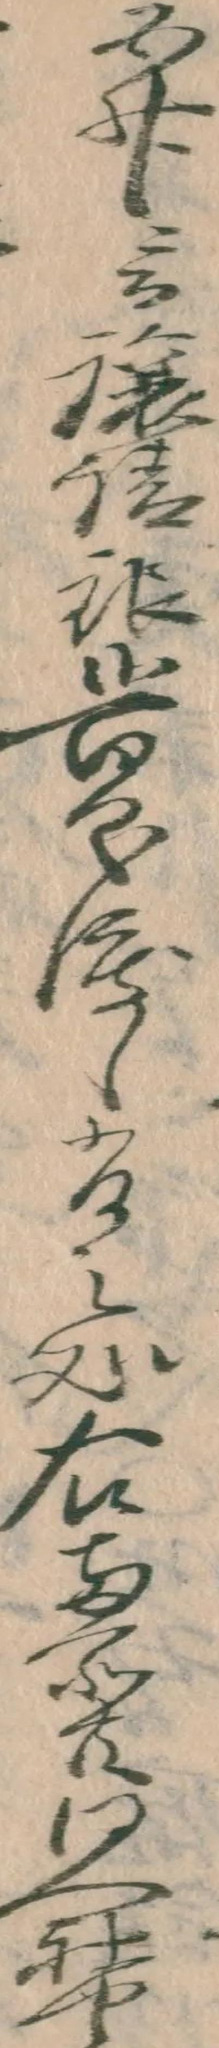五升ニ而譲請銀弐百匁渡候有之処右両所共同人社中
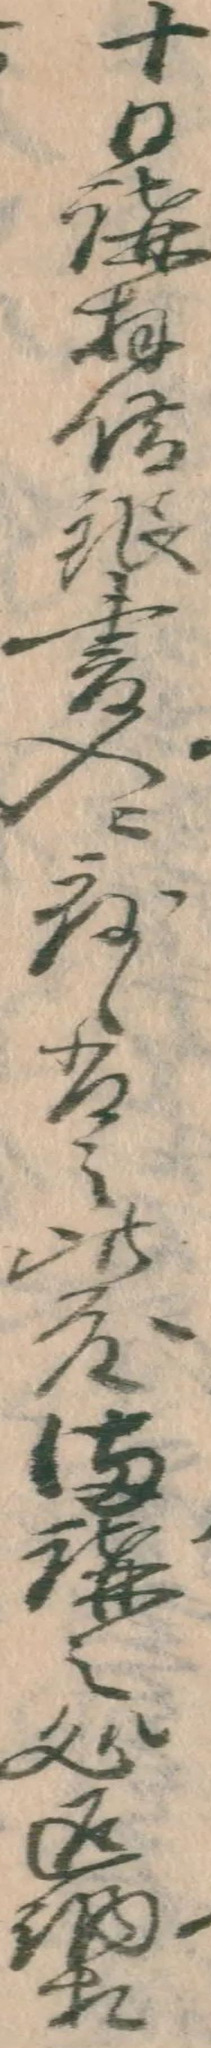十日講拝借銀書入ニ度候有之此度満講之処追納相
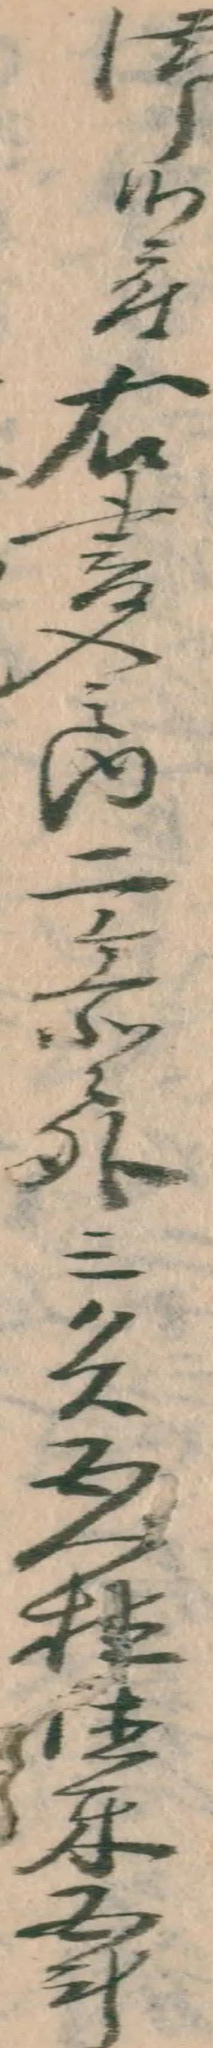滞候ニ付右書入之内二ヶ所之外ミクス五人植徳米五斗
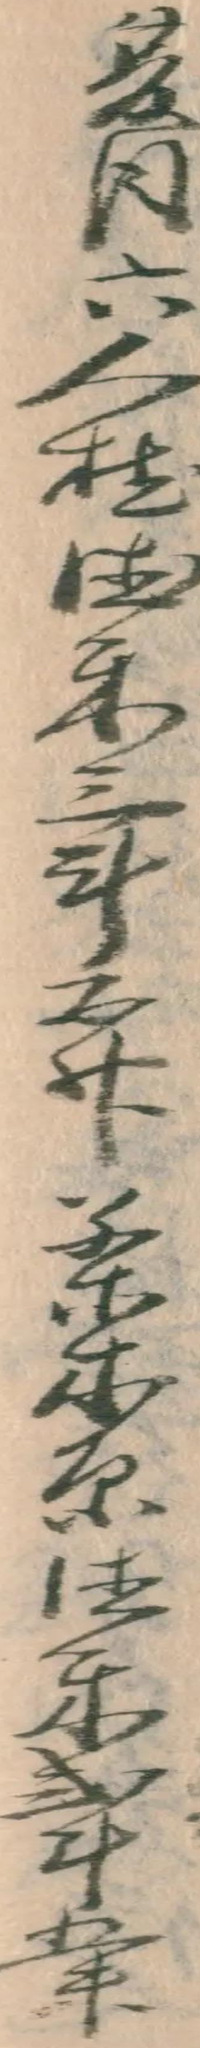麦目六人植徳米三斗五升茶木原植米弐斗五升
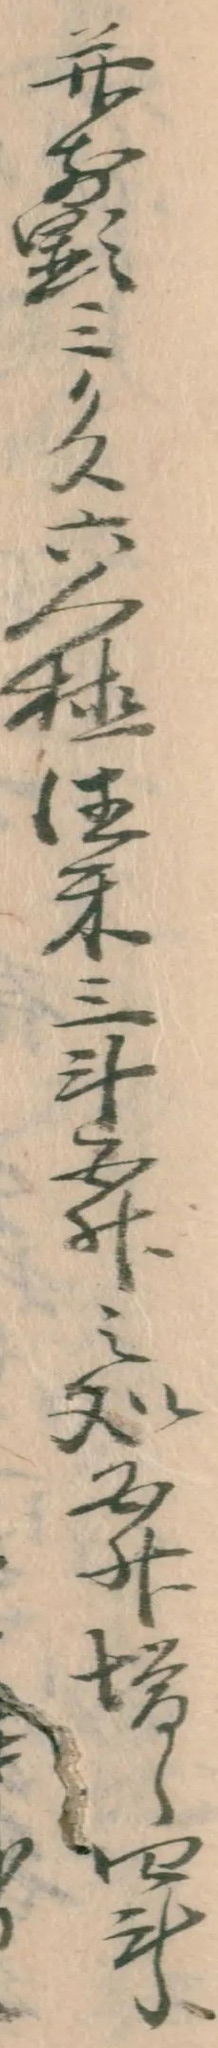并前顕ミクス六人植徳米三斗五升之処五升増し四斗
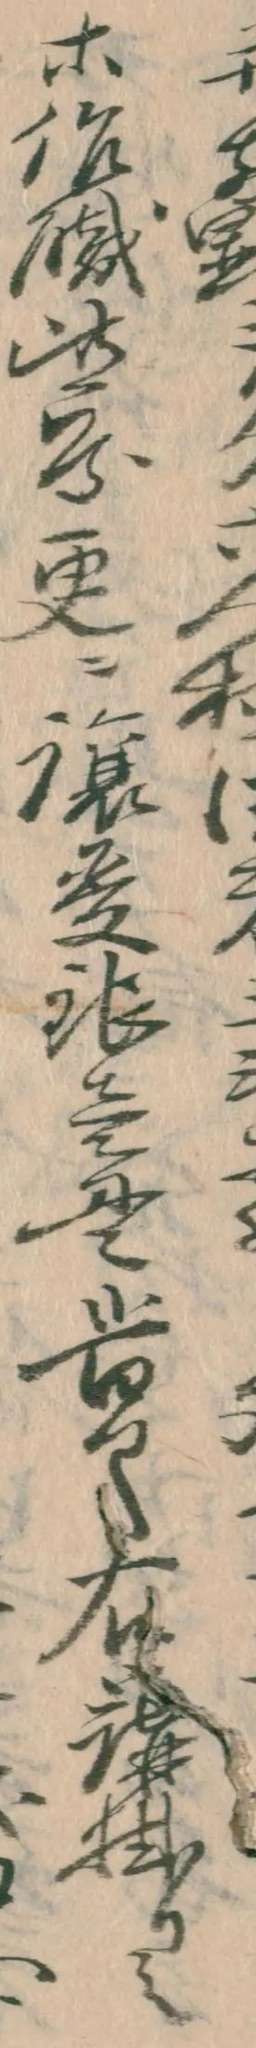等作職此度更ニ譲受銀壱貫弐百文右講掛り之
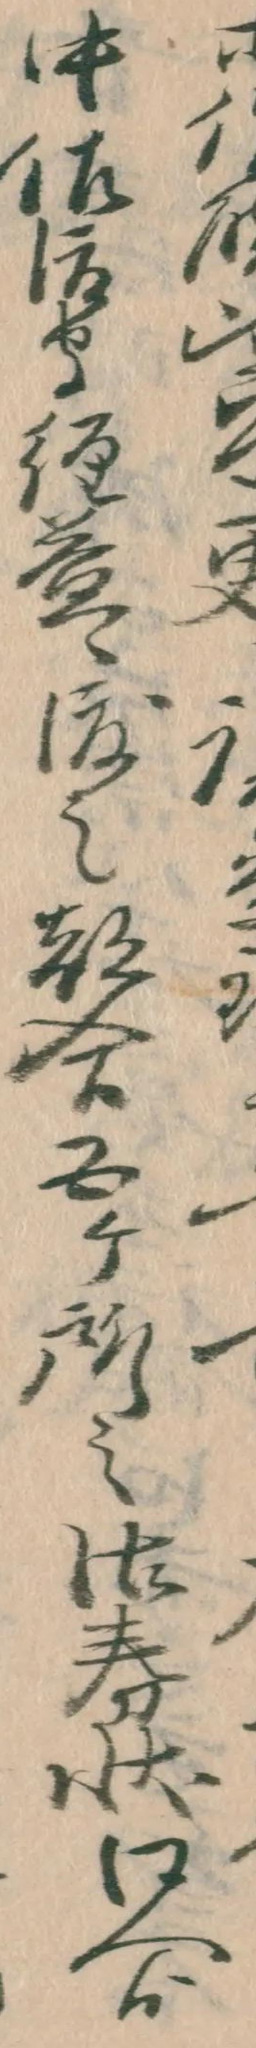中佐渡守経益へ渡之都合五ケ所之沽券状同人ゟ
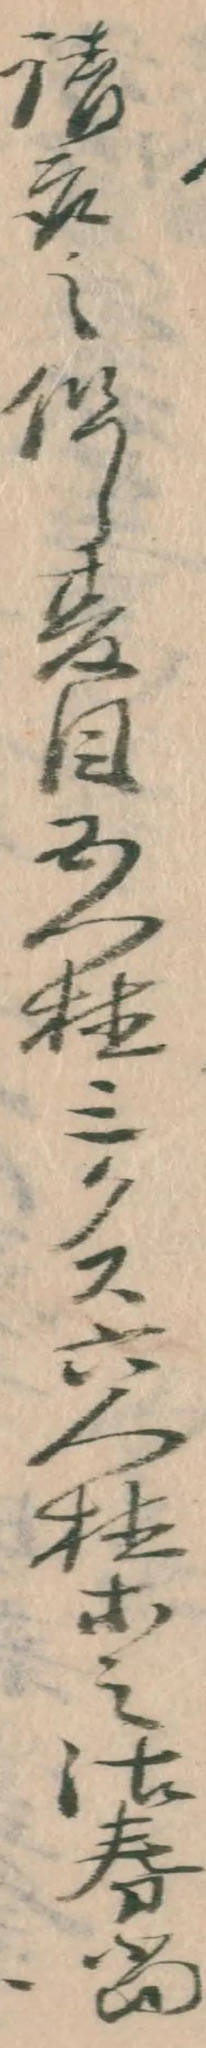請取之但し麦目五人植ミクス六人植等之沽券当
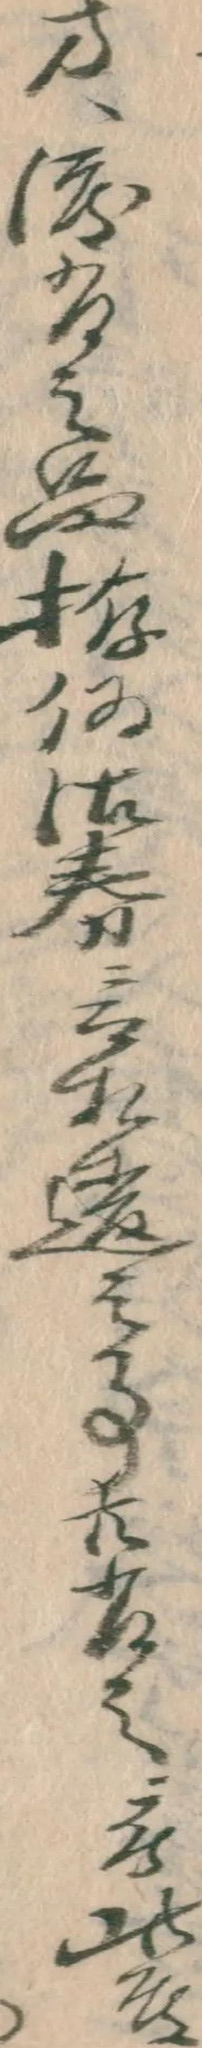方へ渡有之品拵何沽券ニ而相違之事共有之ニ付此度
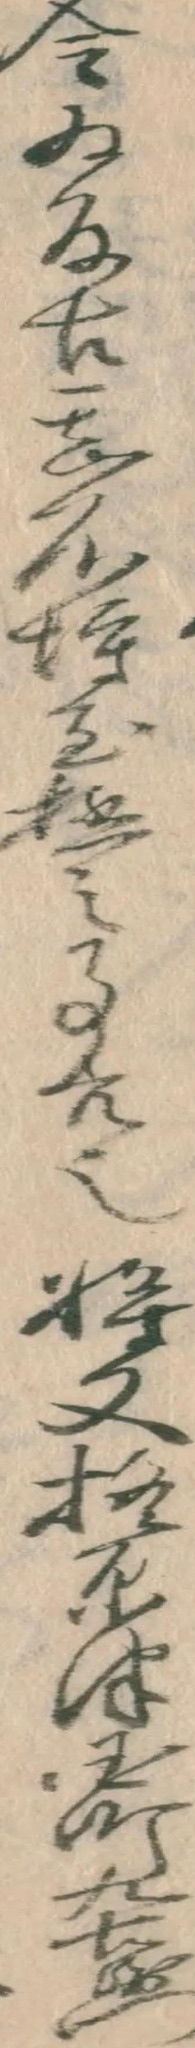令為反古甚不埒至極之事共也将又柊原津国町九右衛門
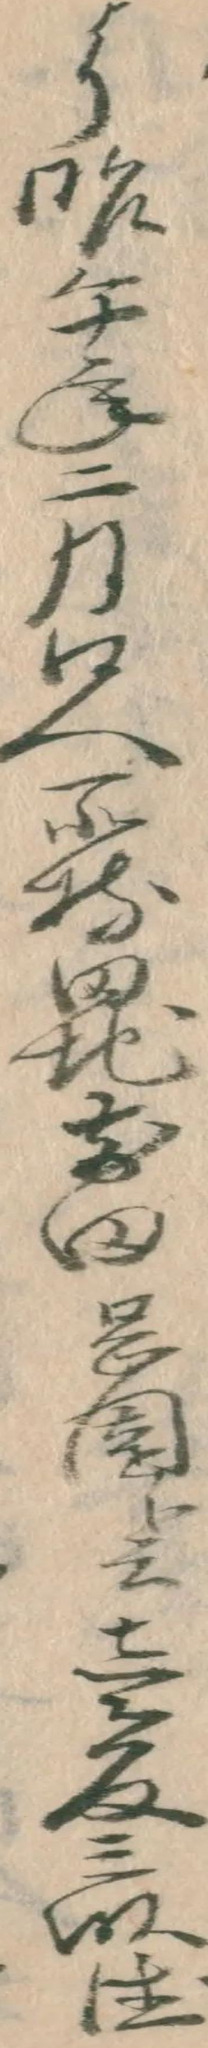より昨午年二月同人所持田地前田岡園ト云壱反三畝植
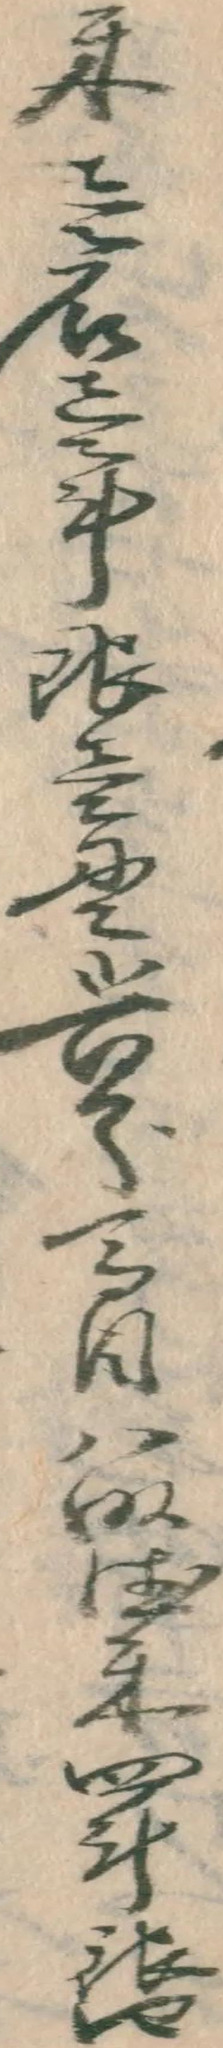米壱石壱斗銀壱貫弐百匁馬目八畝徳米四斗銀四
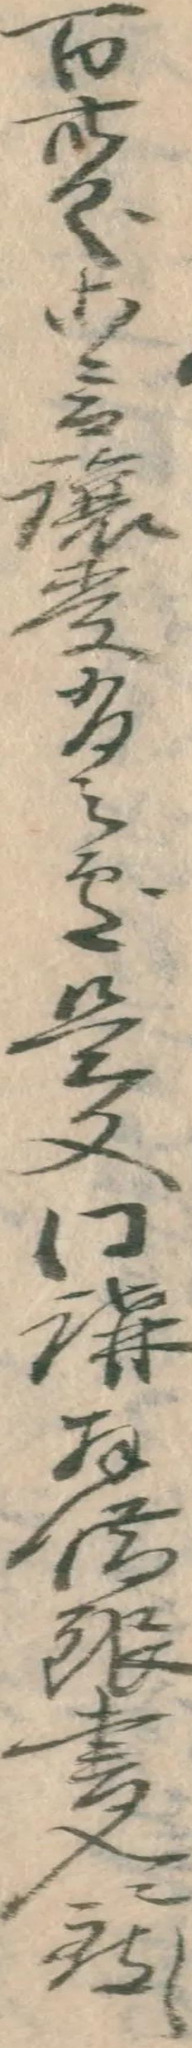百廿匁等ニ而譲受有之処是又同講拝借銀書入ニ致し
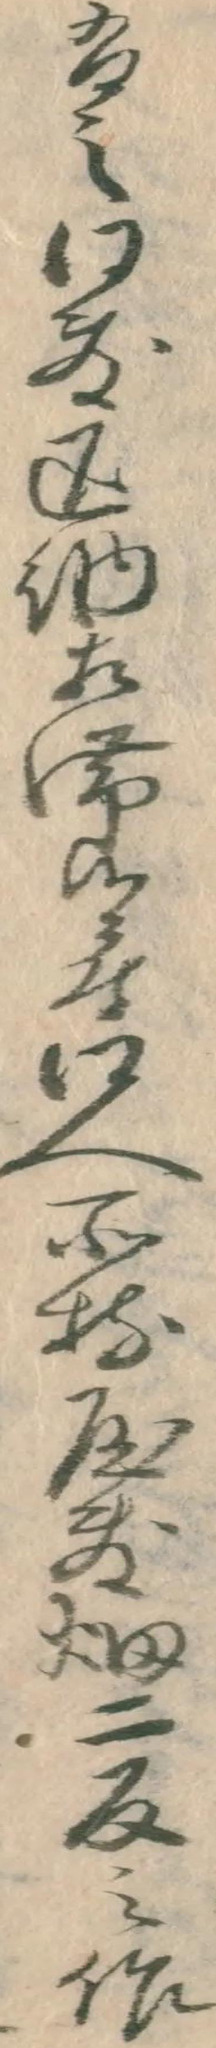有之同度退納相滞候ニ付同人所持屋敷畑二反之作
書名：賀茂社記録. 第67冊
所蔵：国立国会図書館 National Diet Library, JAPAN
